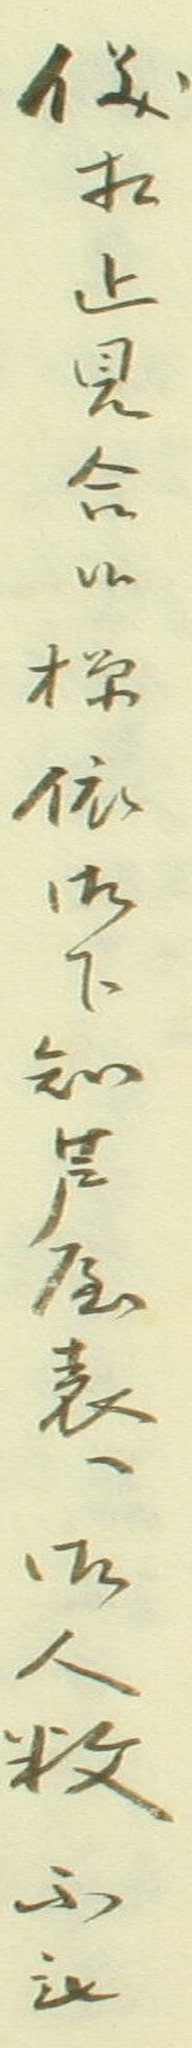儀相止見合候様依御下知芦屋表へ御人数不被
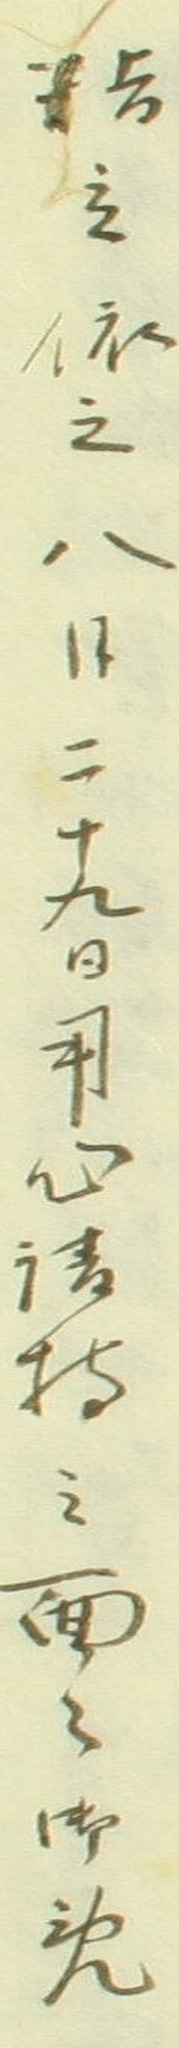指立依之八月二十九日用心請持之面々御免
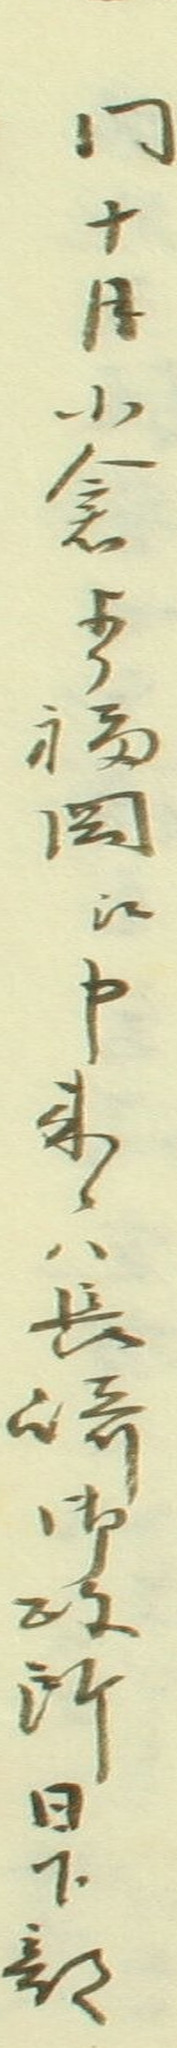一同十月小倉より福岡江申来候は長崎御政所日下部
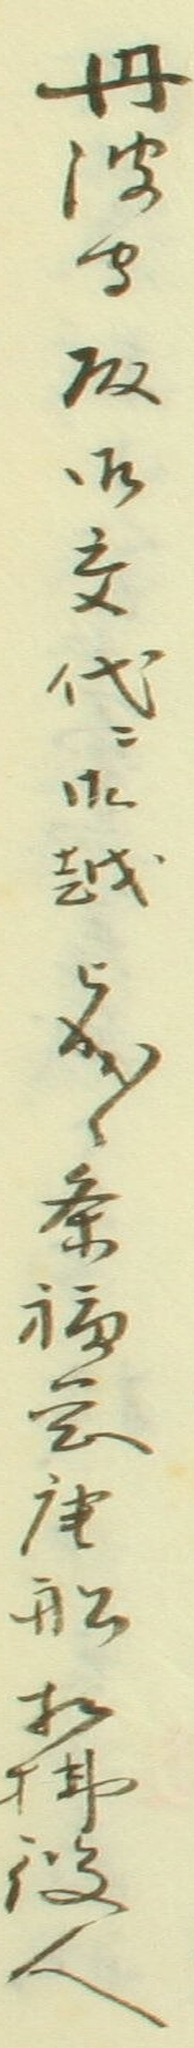丹波守殿御交代に御越被成候条福岡ヘ唐船相払役人

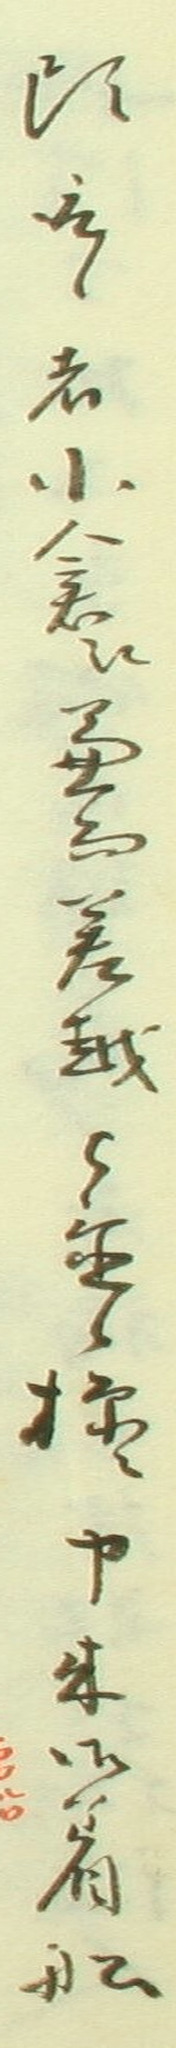頭取候者小倉江兼而差越被置候様に申来御着船
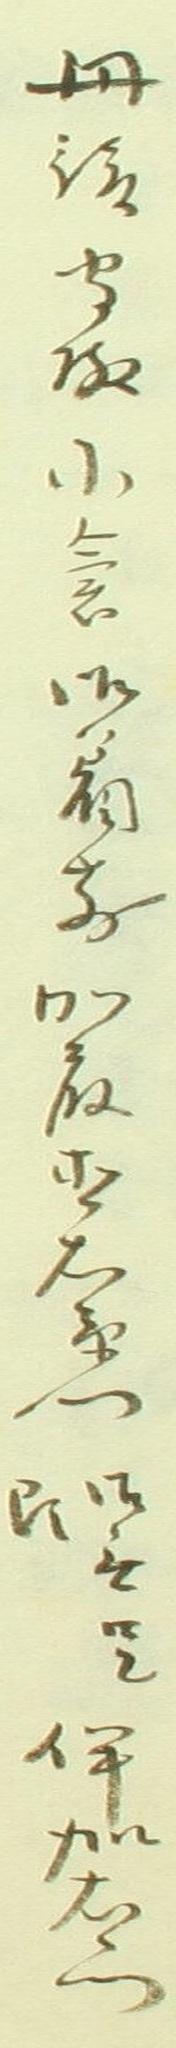丹後守殿小倉御着前加藤直右衛門御無足頭伊賀右衛門
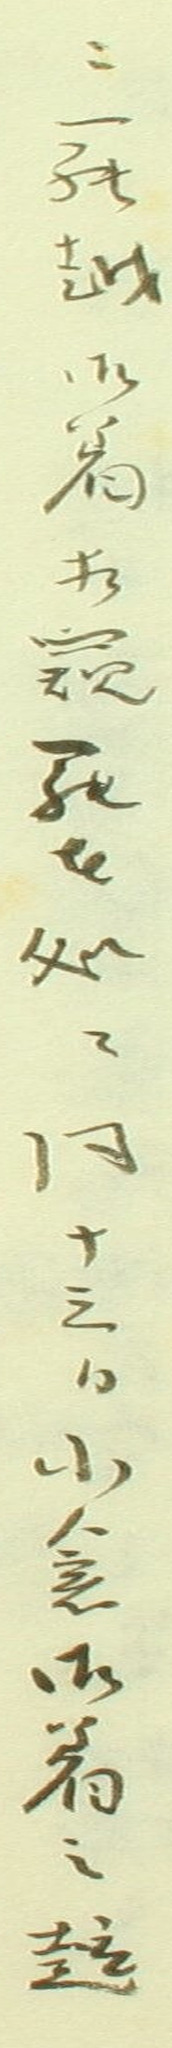に罷越御着相窺罷有処に同十三日小倉御着之趣
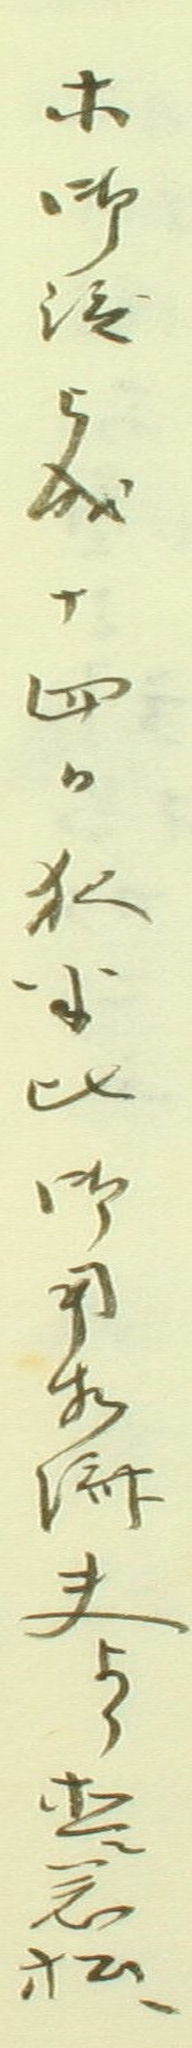等御？被成十四日夜半頃御用相済夫より直に若松へ
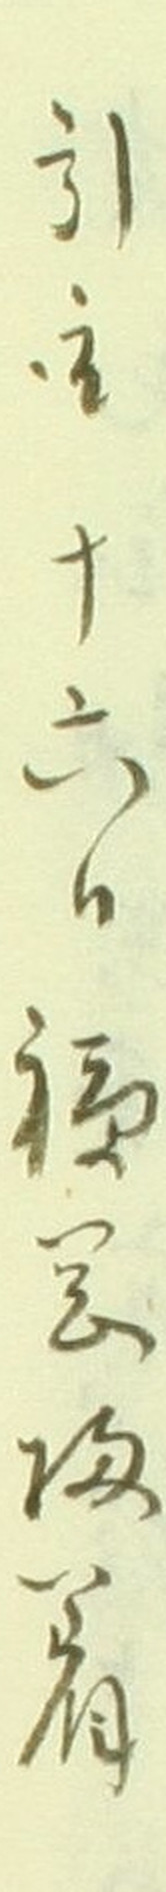引取十六日福岡帰着
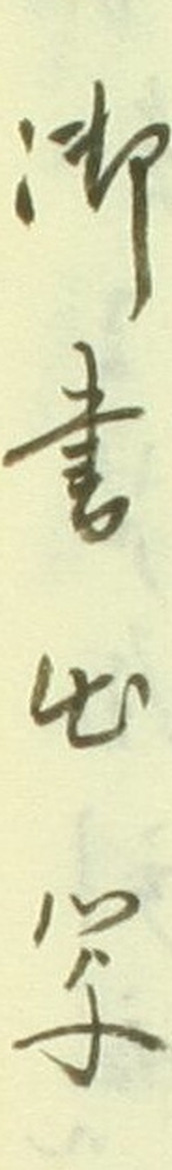御書出写
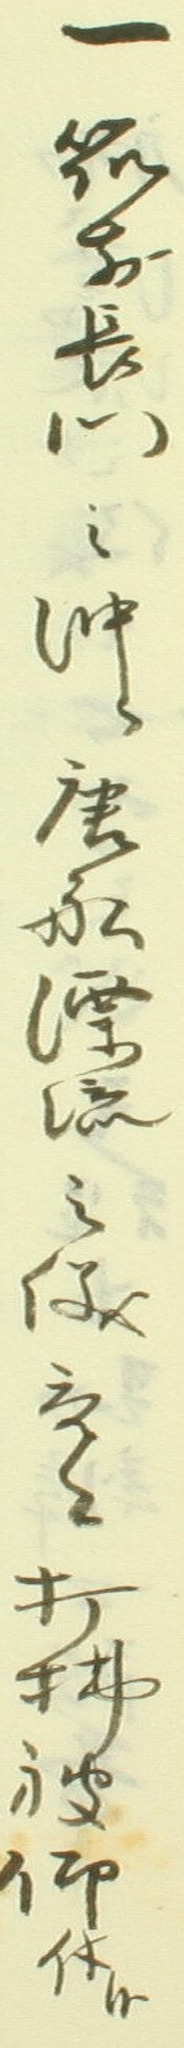一筑前長門之沖へ唐船漂流之儀度々打払被仰付候
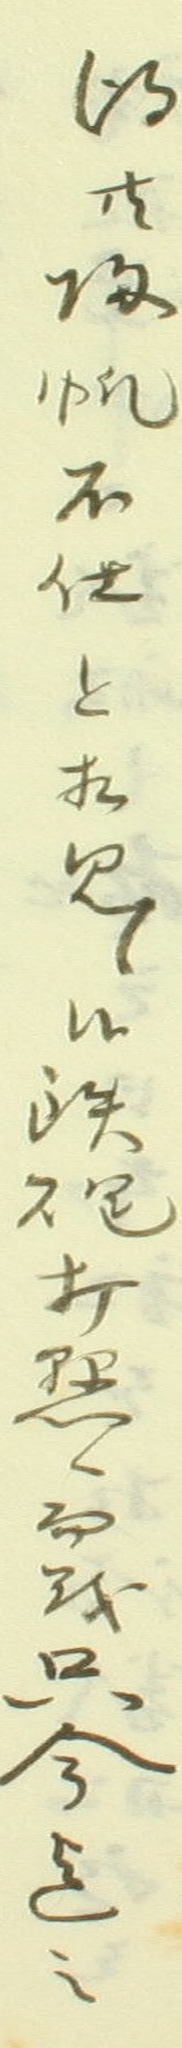得共帰帆不仕と相見候鉄砲打懸候而越只今迠之
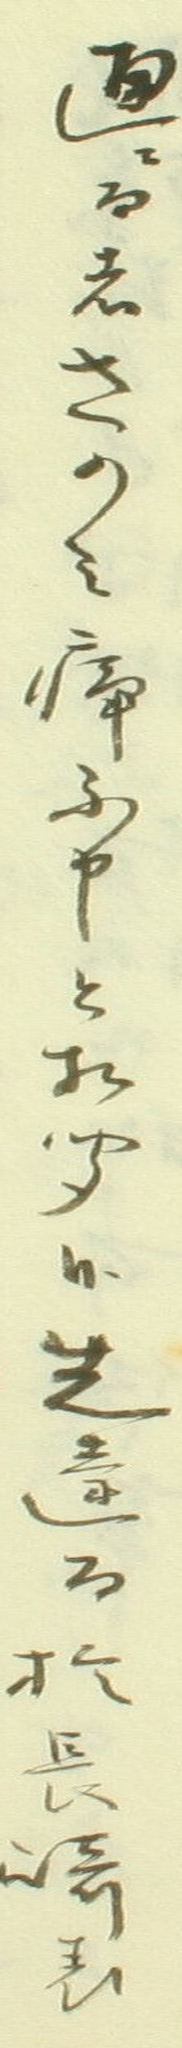通に而者さのみ痛不申と相聞候先達而於長崎表
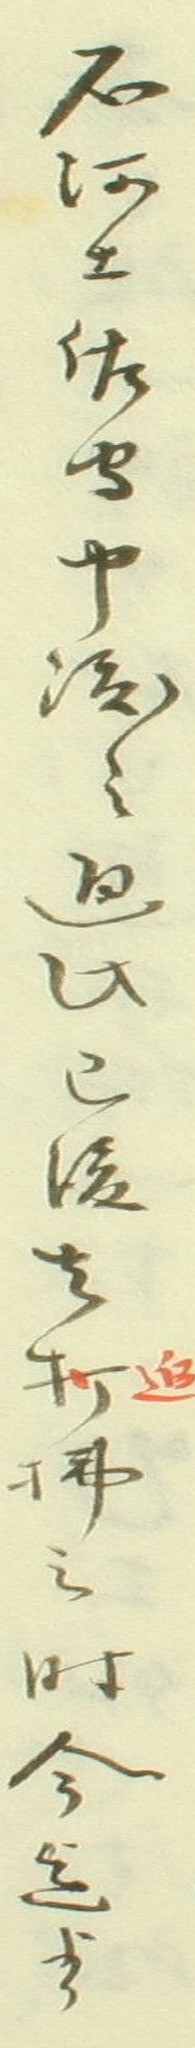石河土佐守申渡之通此己後は打は払之時今迄
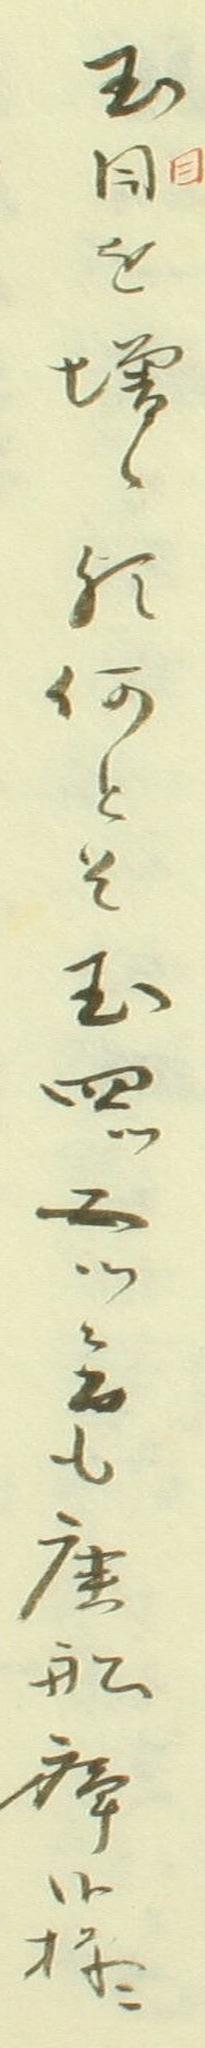玉目を増候？何とそ玉四つ五つに而も唐船痛候様に
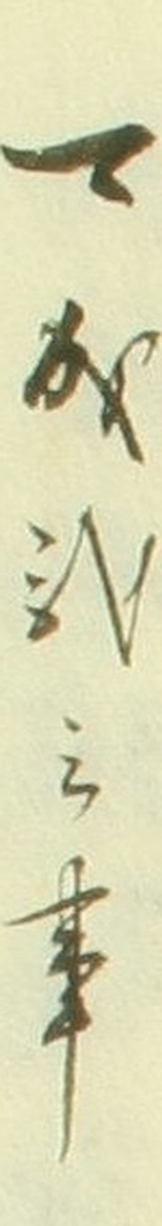可成哉之事
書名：唐船漂流記 三
